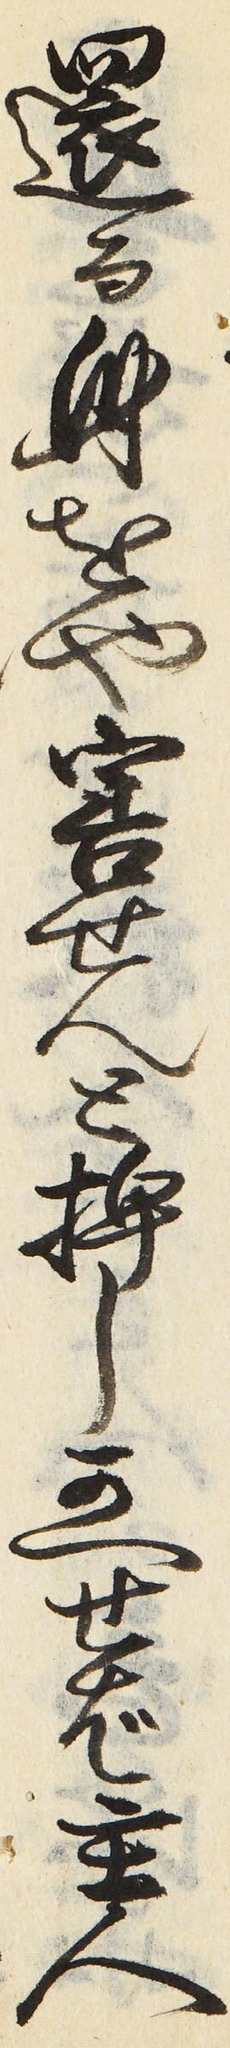還而身をや害せんと押しかへせば主人
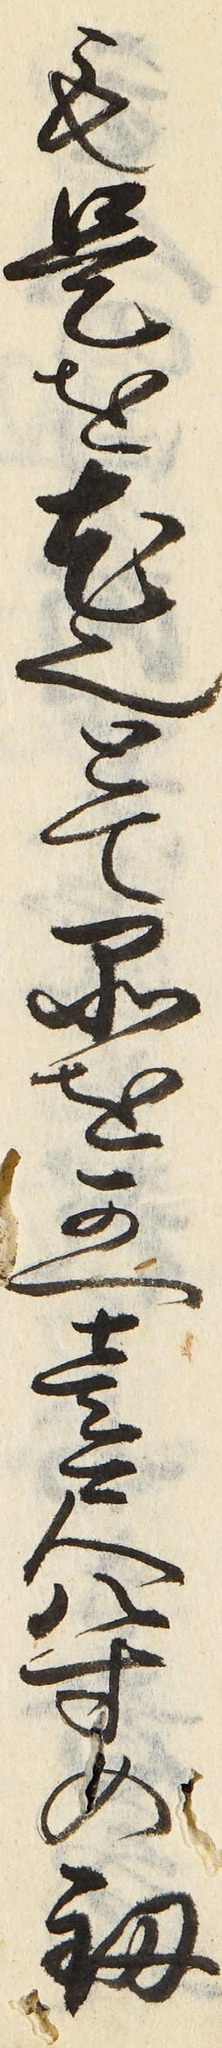も是を尤也とて品をかへ壱尺八寸の釼
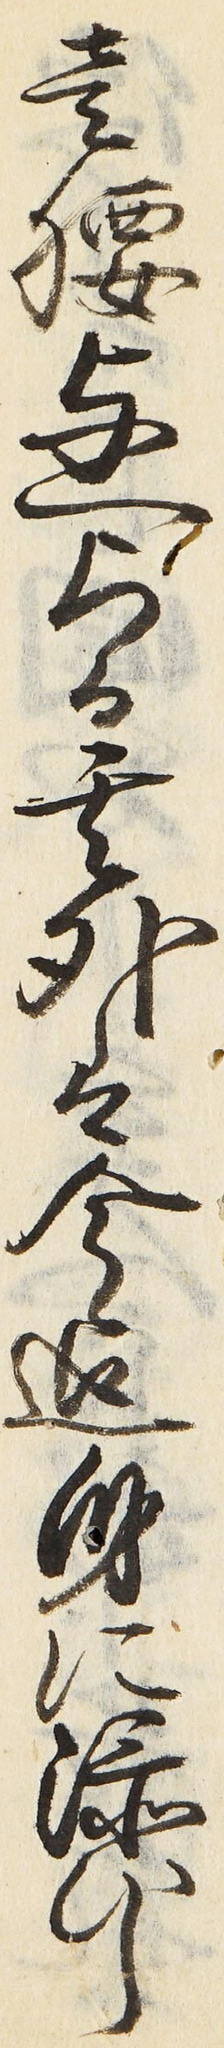壱腰与へらる其外は今迄身に添ひし
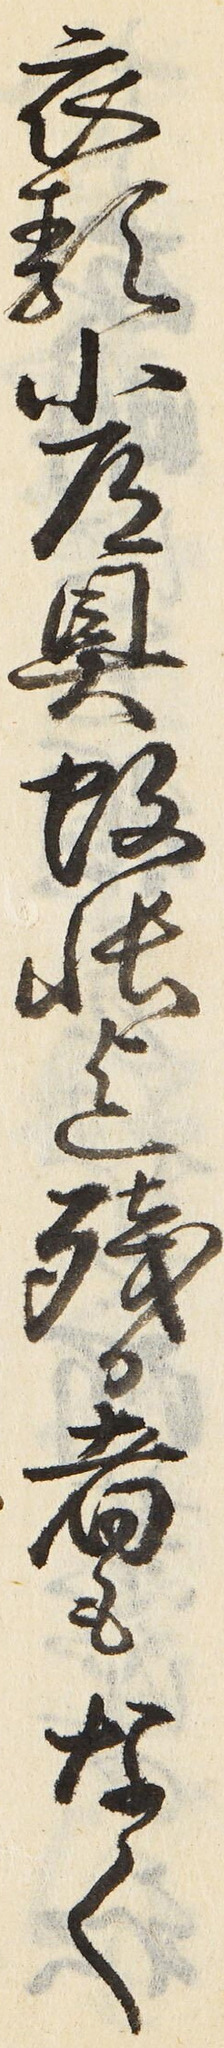衣類小道具蚊帳迠残る者もなく
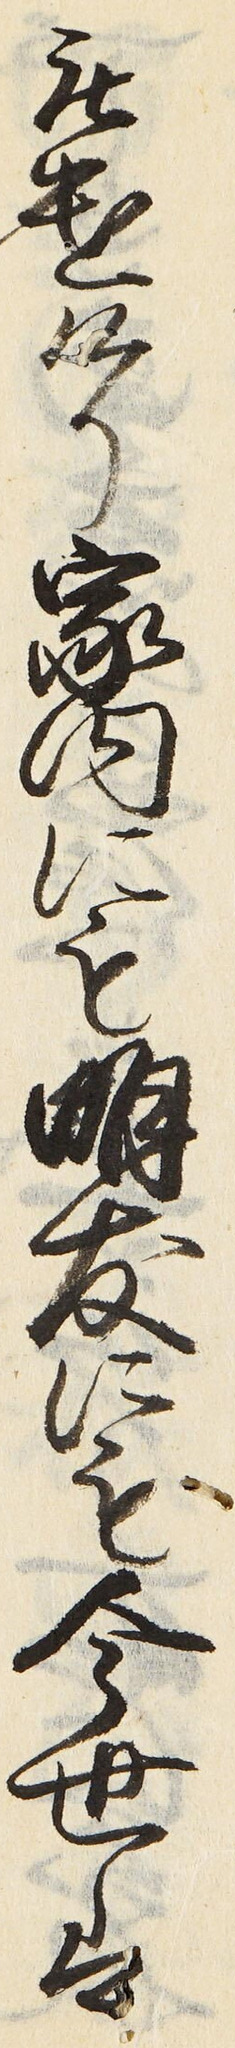被遣けり家内にも朋友にも今世は
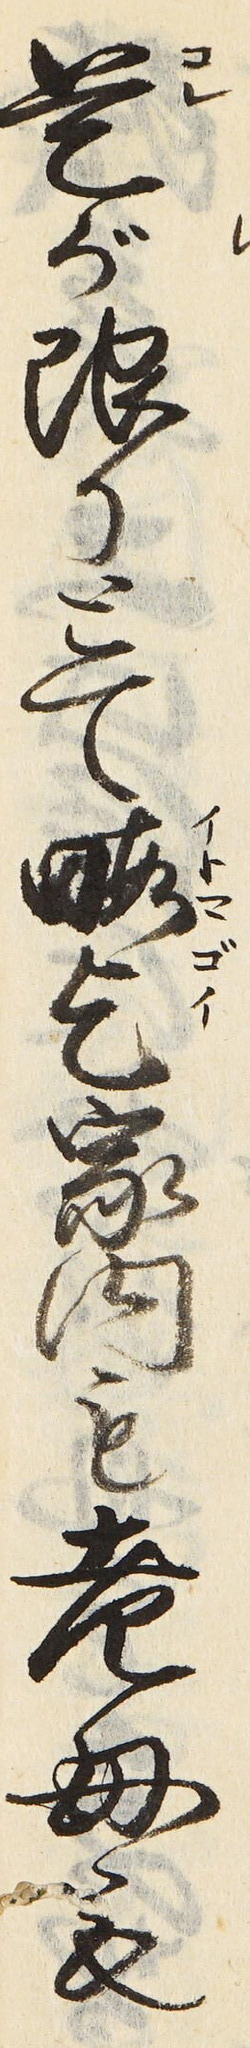是が限りとて暇乞家内も老母も
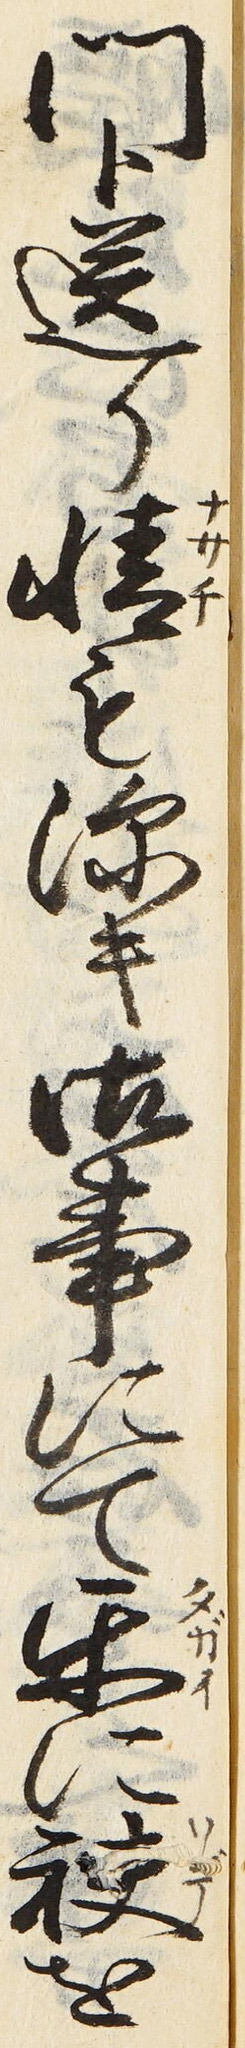門と送り情も深き御事にて互に袂を
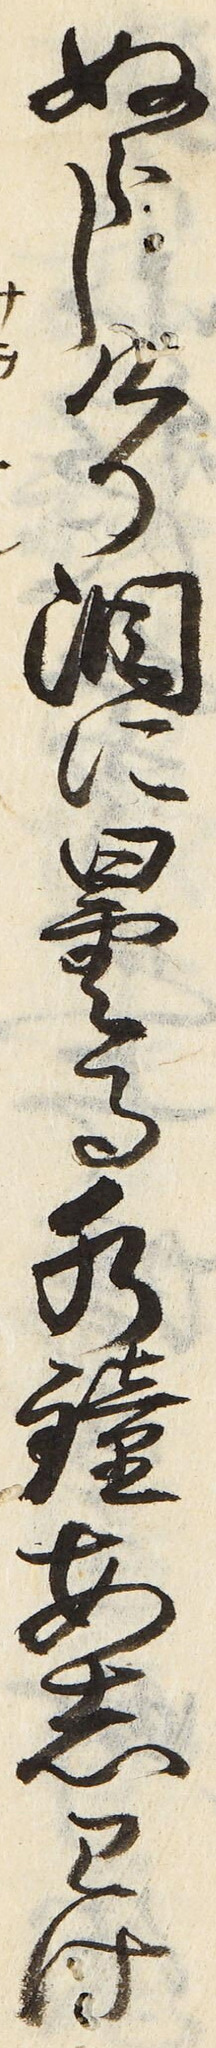ぬらしけり泪に曇る水鐘あしわけ
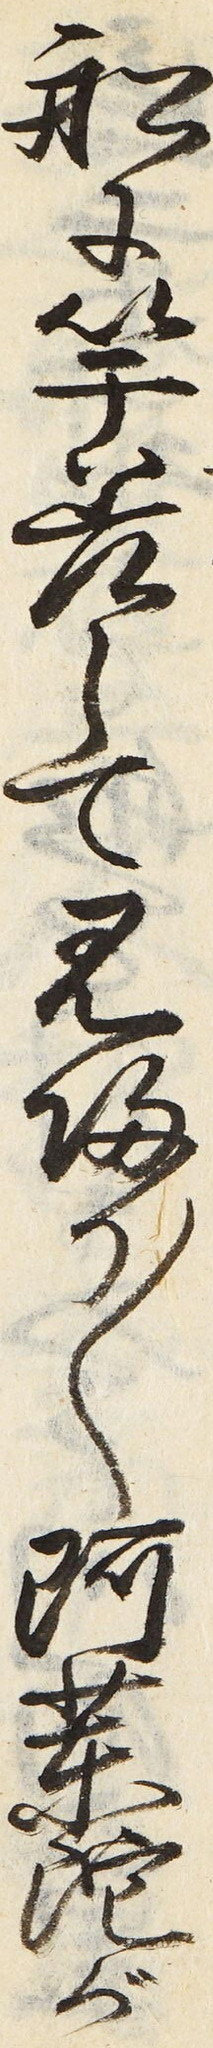船に竽差して見帰り〳〵阿蘭陀が
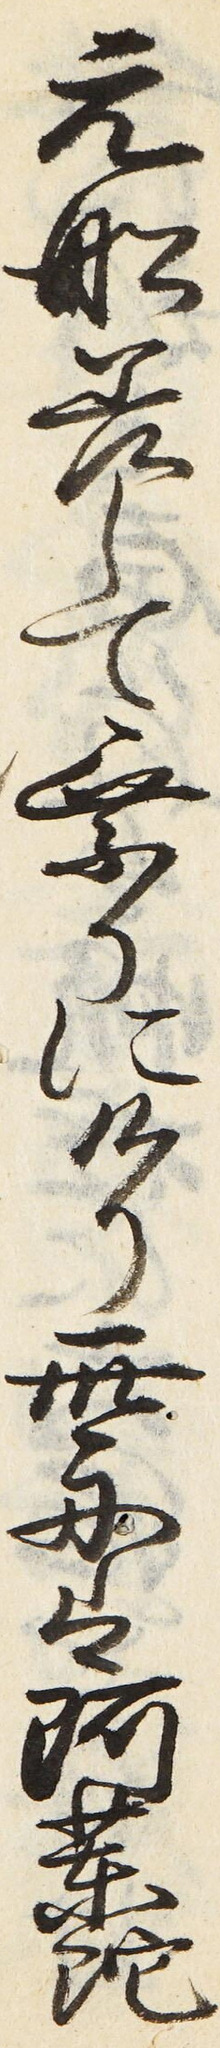元船差して乗りにけり此舟は阿蘭陀
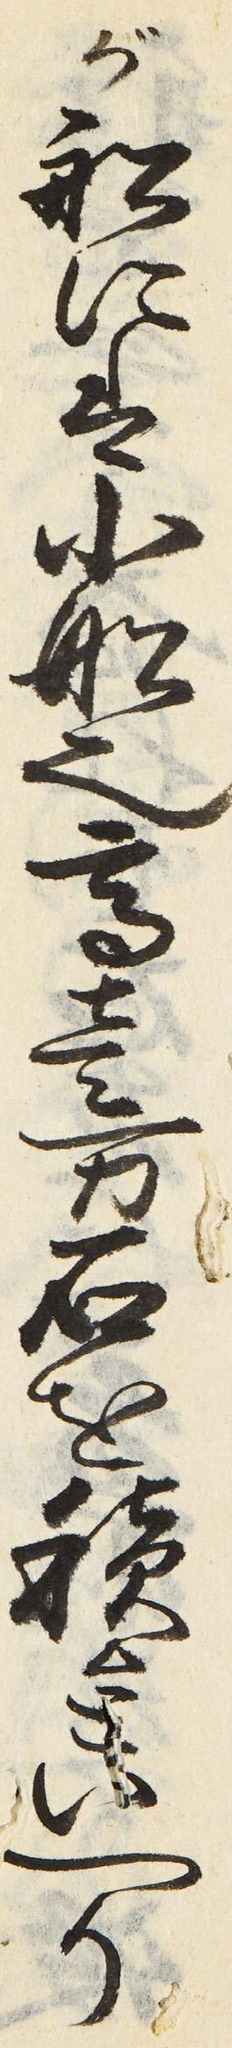が船には小船也高壱万石を積むといへり
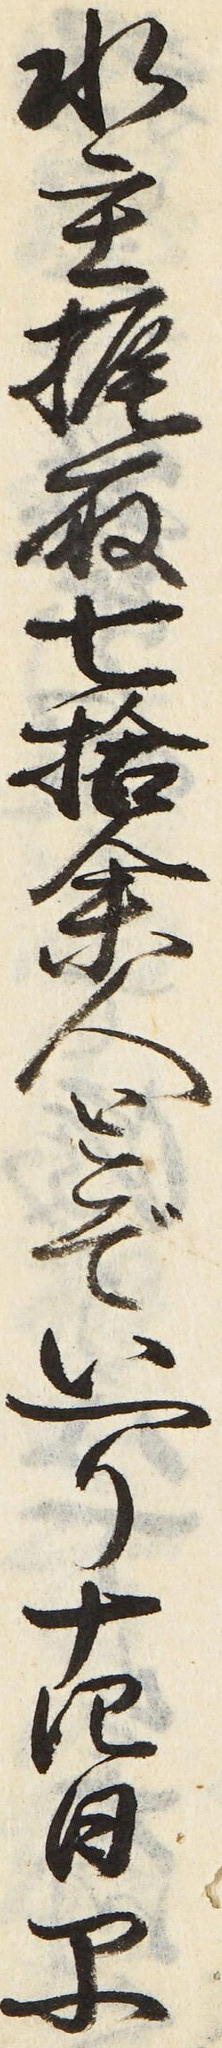水主梶取七拾余人とぞいへり十四日早
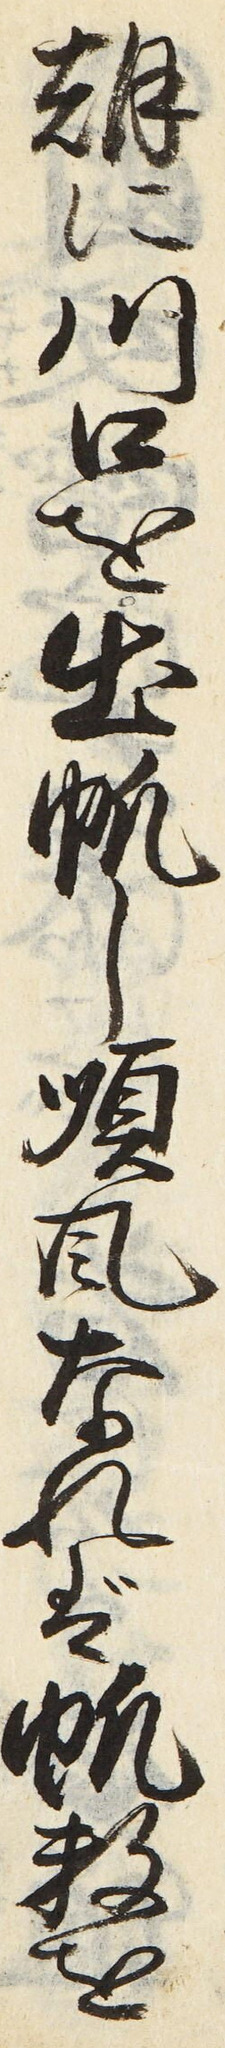朝に川口を出帆し順風なれば帆数を
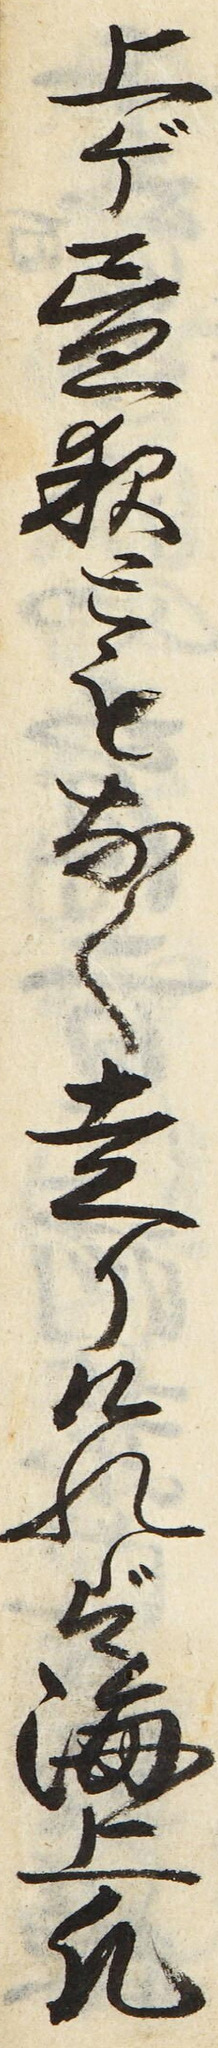上げ昼夜ともなく走りければ海上凡

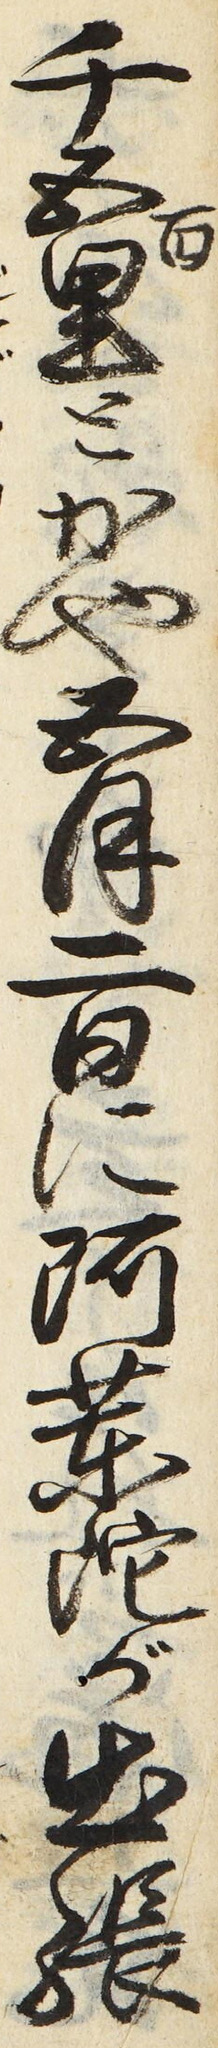千五百里とかや五月二日に阿蘭陀が出張
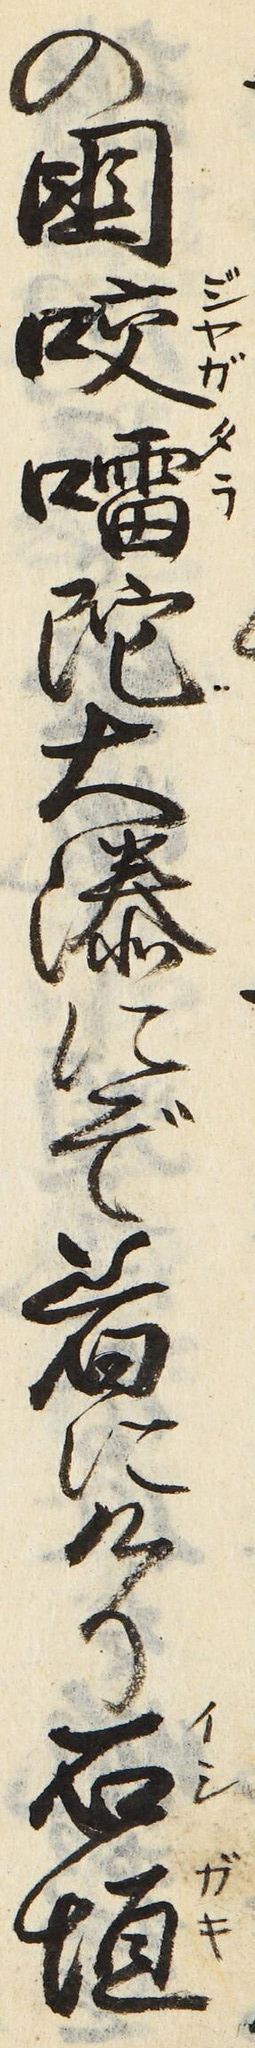の国咬陀大湊にぞ着にけり石垣
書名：華夷九年録
